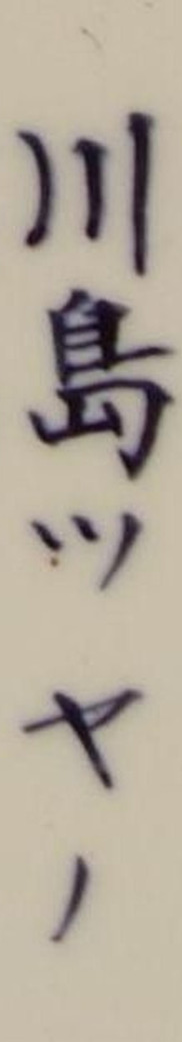川島ツヤノ
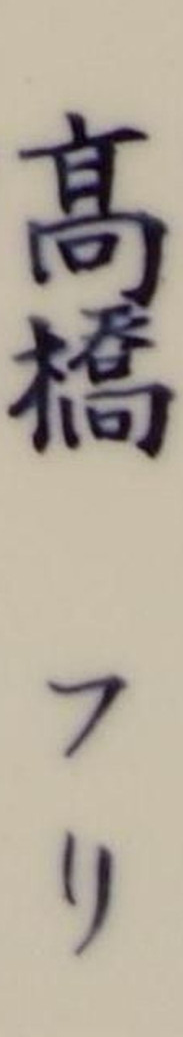高橋フリ
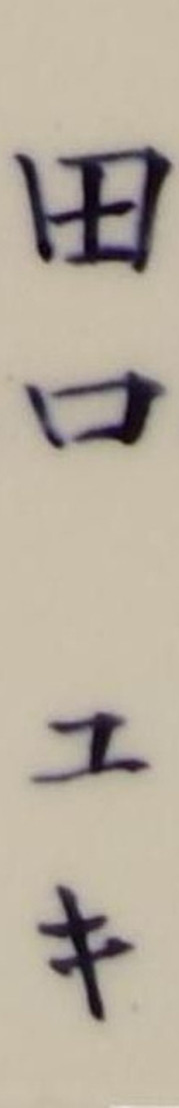田口ユキ
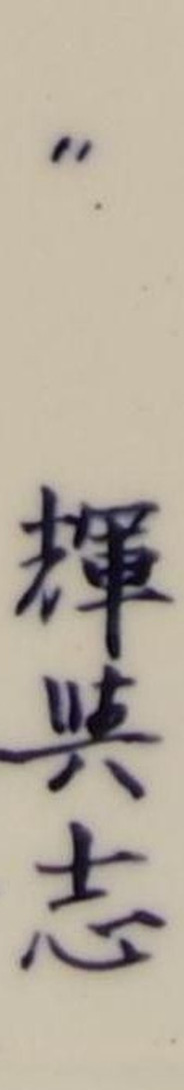輝与志
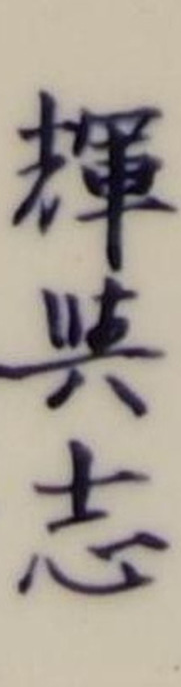輝与志
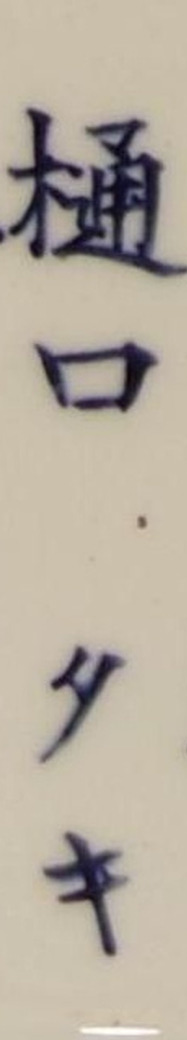樋口タキ
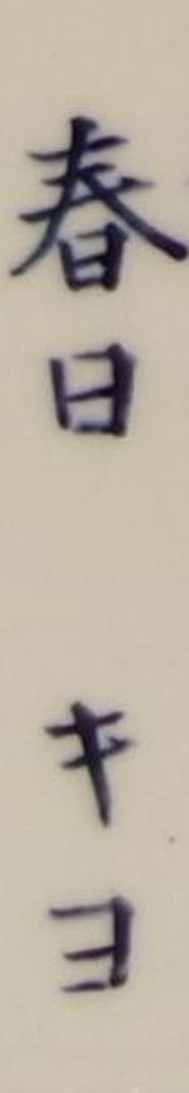春日キヨ
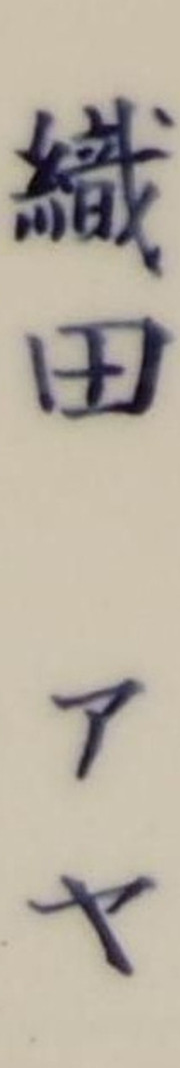織田アヤ
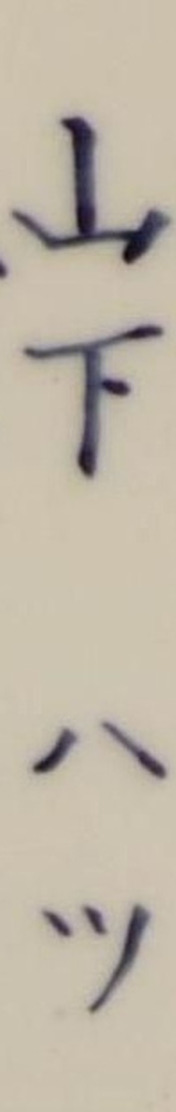山下ハツ
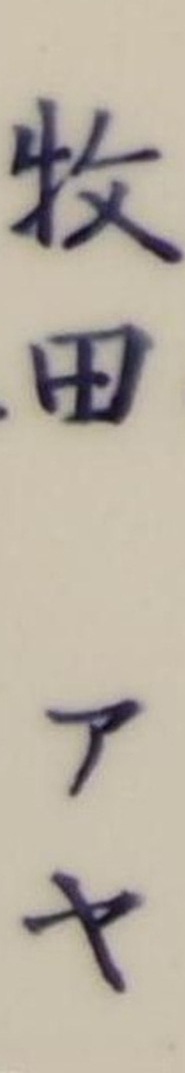牧田アヤ
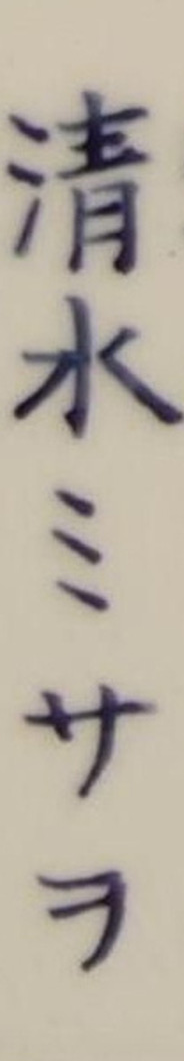清水ミサヲ
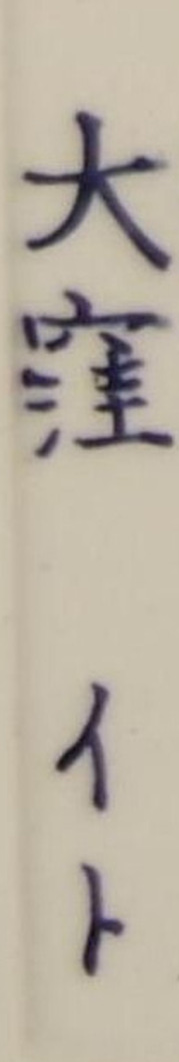大窪イト

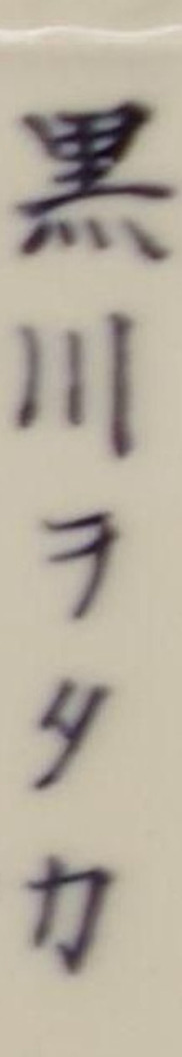黒川ヲタカ
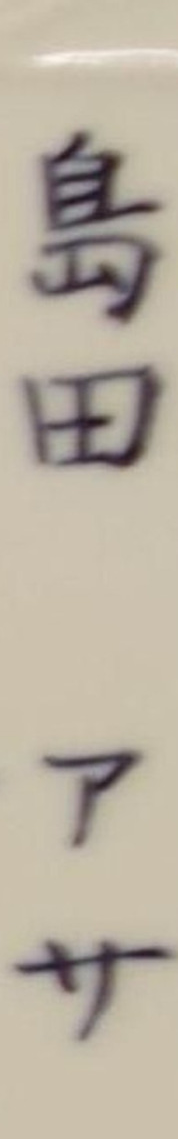島田アサ
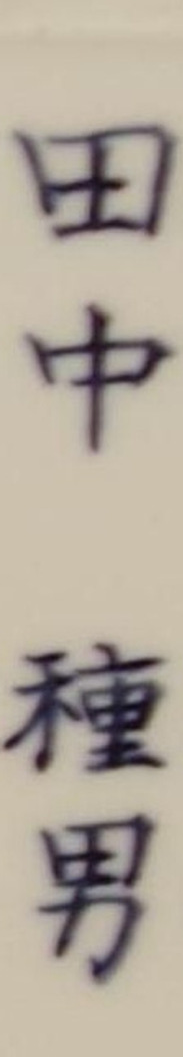田中種男
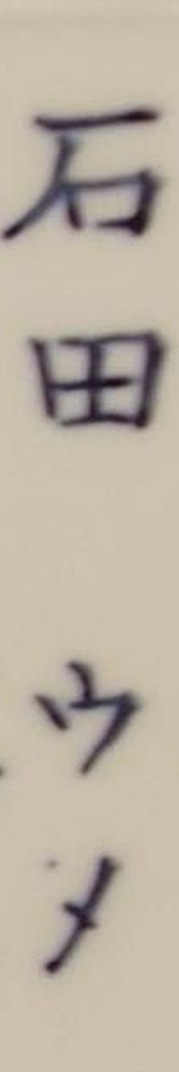石田ウメ
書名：M~S
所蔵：高野山金剛峯寺
